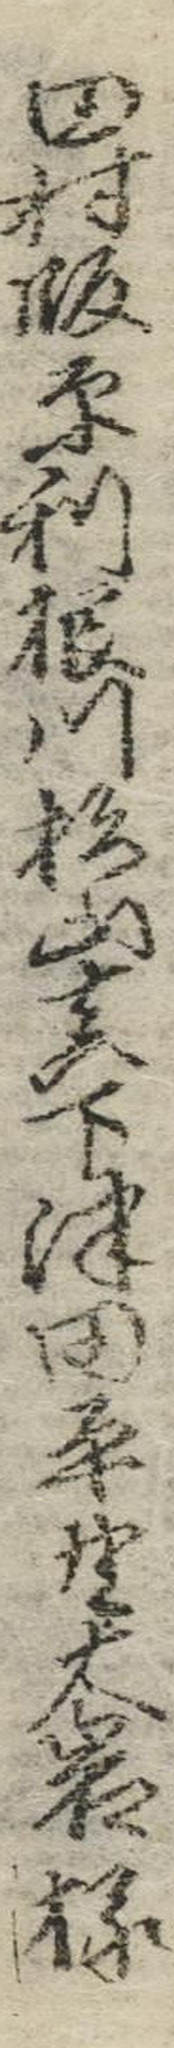田村飯原利根川松山真下津田平野大岩様
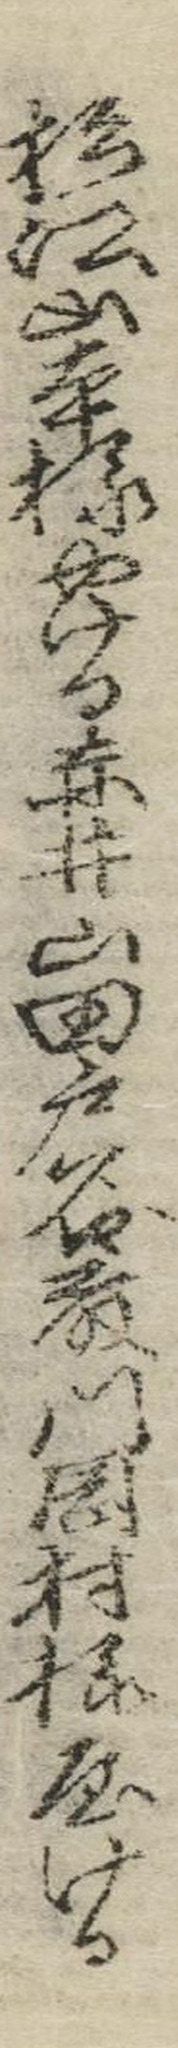松江山本様やける赤井山田戸谷藤川岡村様やける
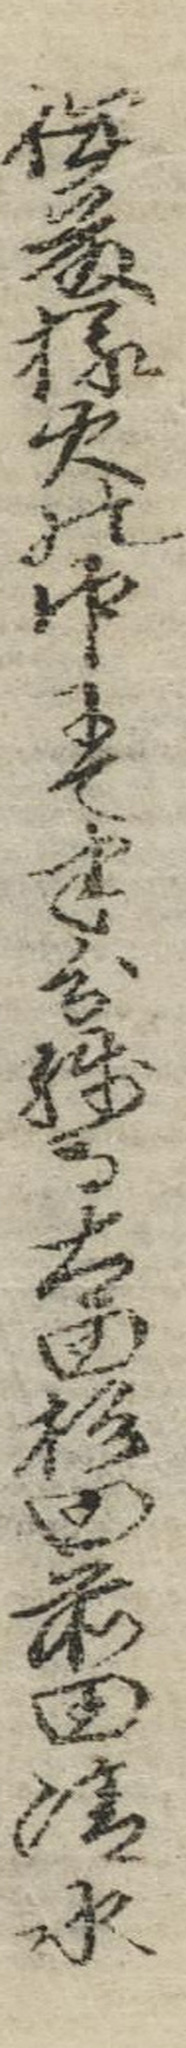伊藤様火の中にて半分残る太田杉田前田清水
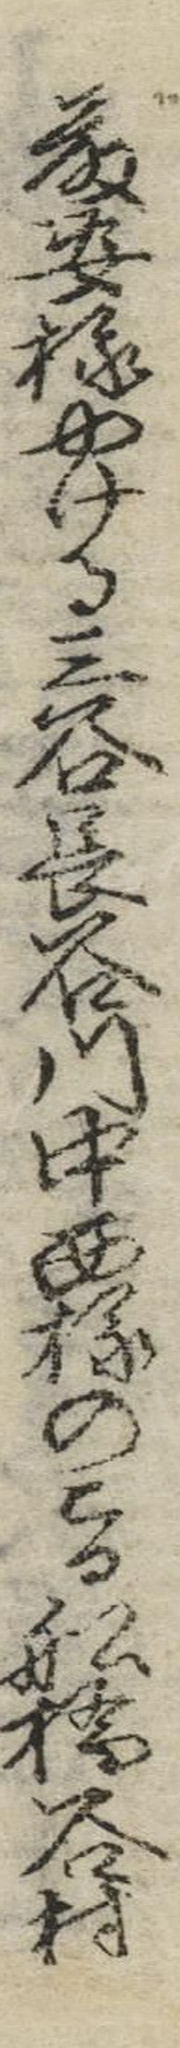藤安様やける三谷長谷川中西様のこる船橋谷村
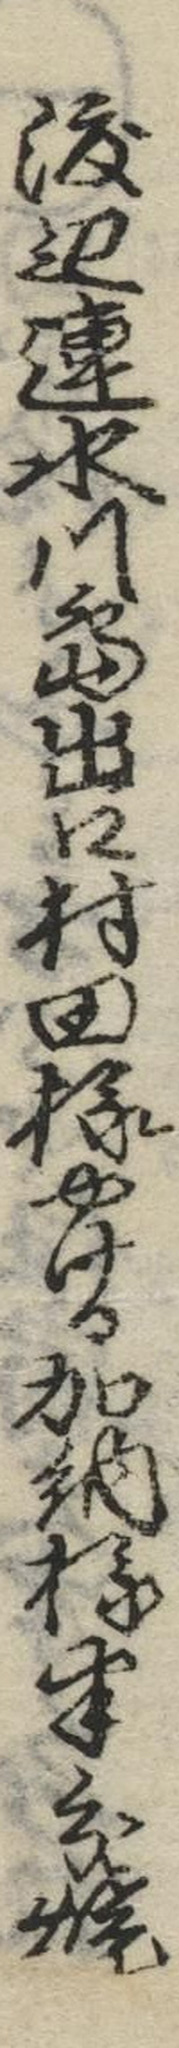渡辺連水川島出口村田様やける加納様半分焼
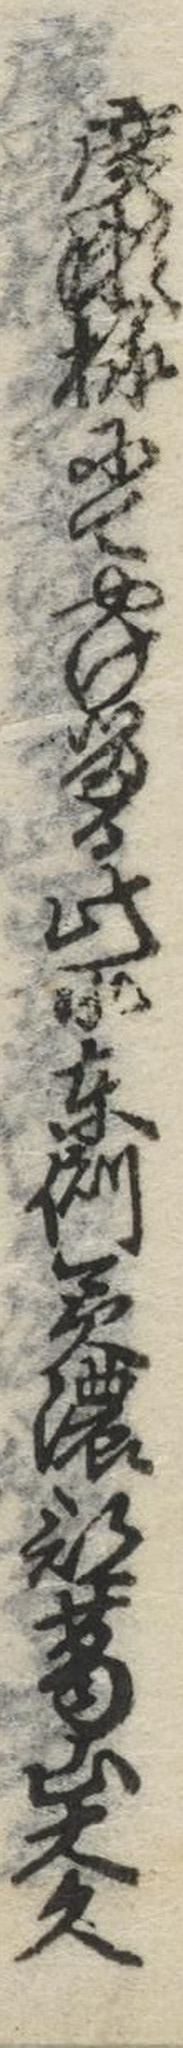廣瀬様にてやけ留る此所東側美濃部蕃山大久
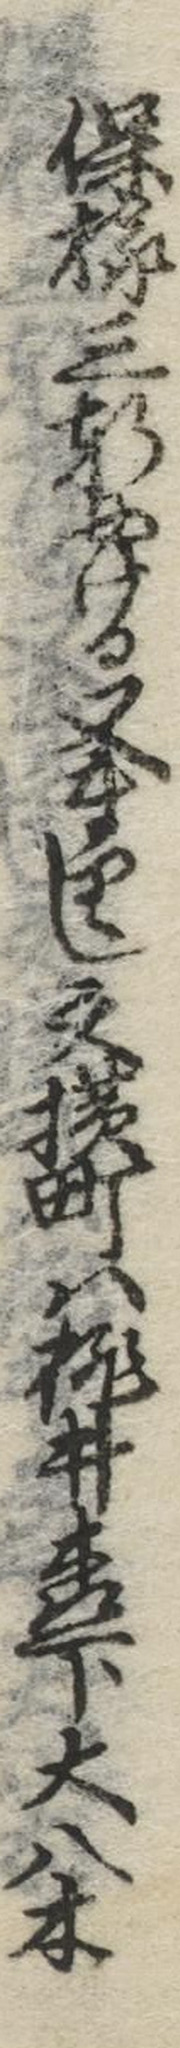保様三軒やける又まりし天横町ハ柳井森下大八木
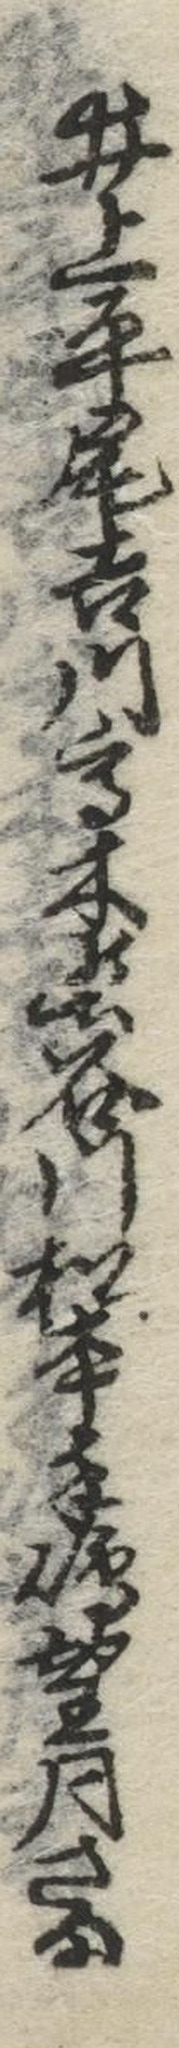井上平尾吉川高木長谷川松本手嶋望月さま
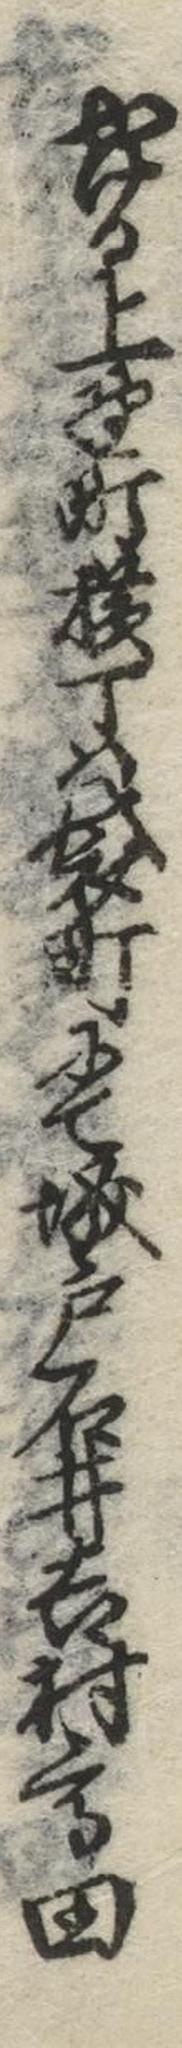やける上野町横丁ハ袋町にて城戸石井吉村高田
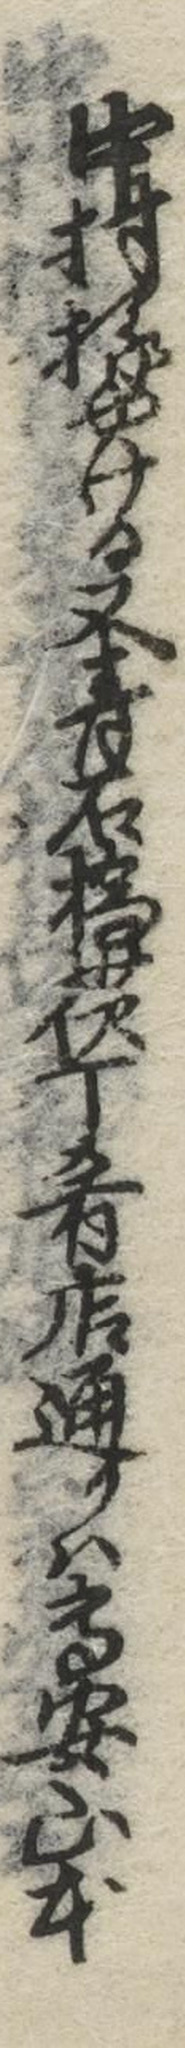中村様やける又青石橋横丁肴店通りハ高安山本
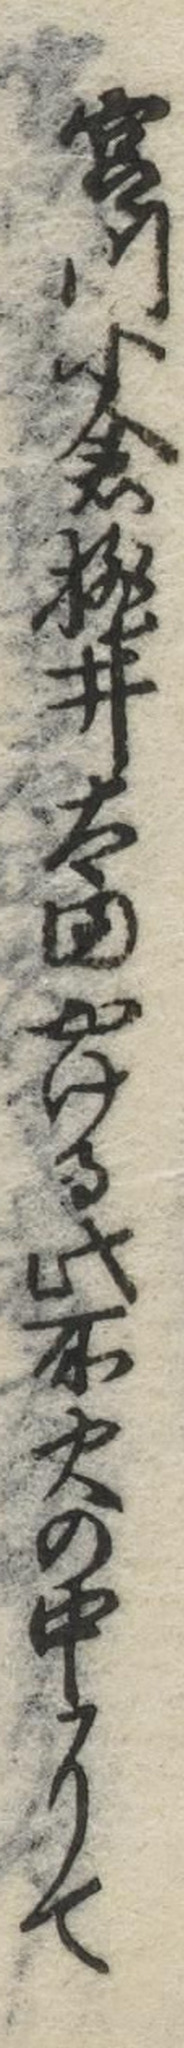宮川小倉柳井太田やける此所火の中にて
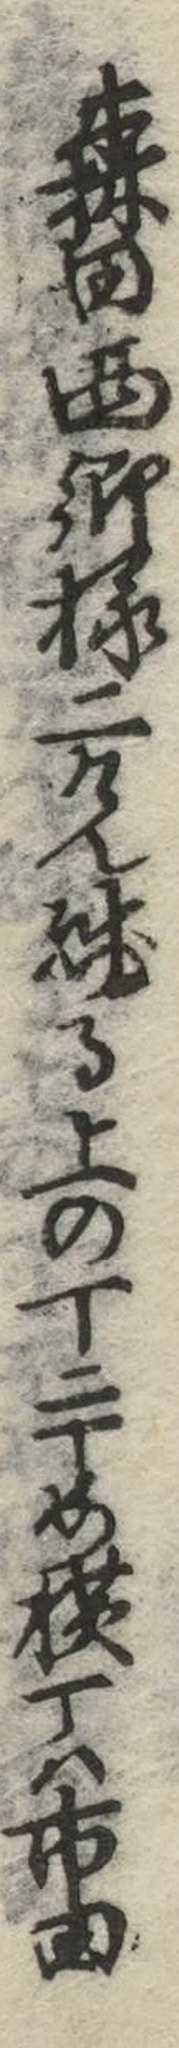森田西郷様二けん残る上の丁二丁め横丁ハ市田
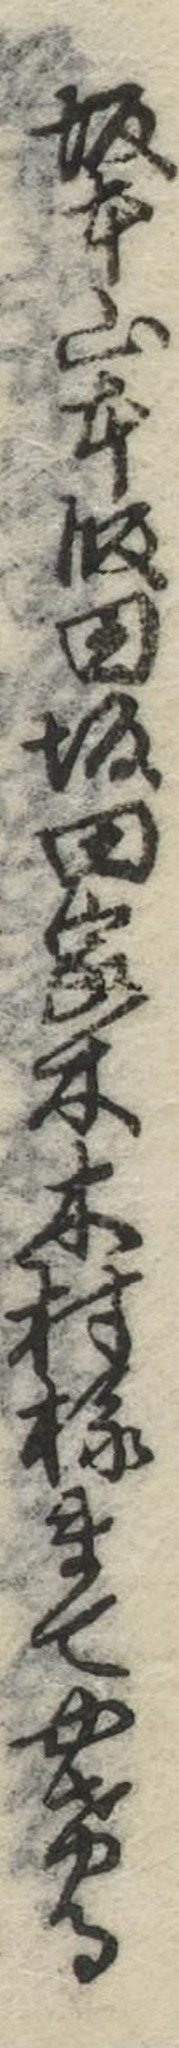坂本山本飯田坂田家木木村様まてやける

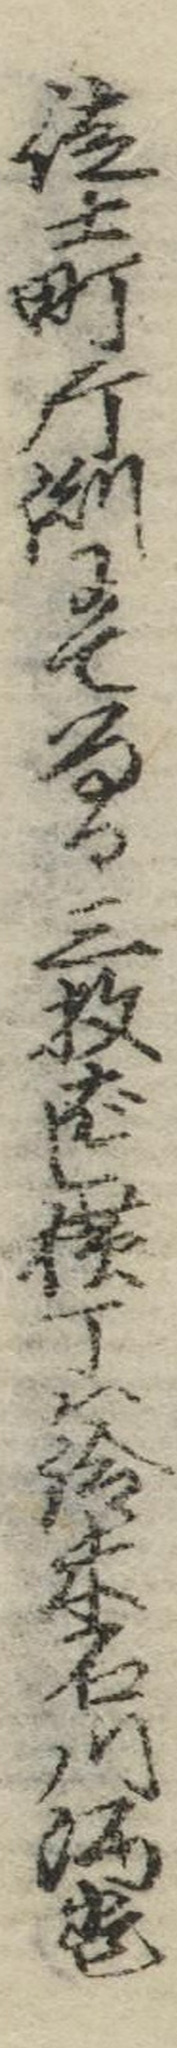徒士町片側にて留る三枚ばし横丁ハ鈴木石川酒巻
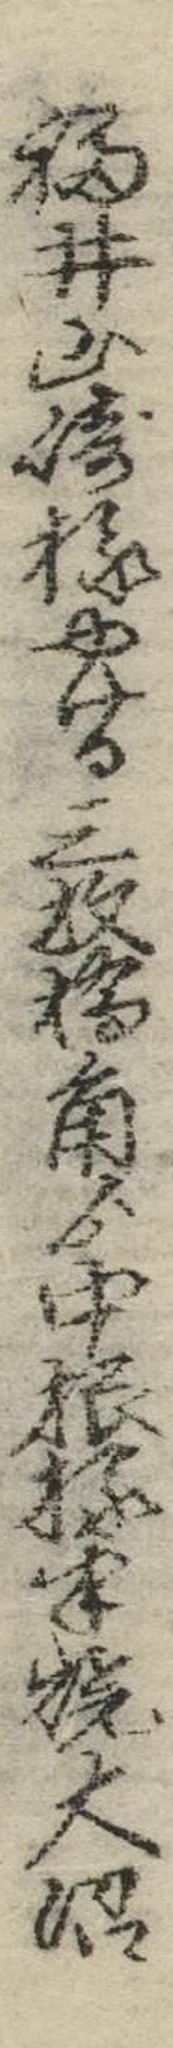福井山崎様やける三枚橋角ゟ中根様半焼大沼
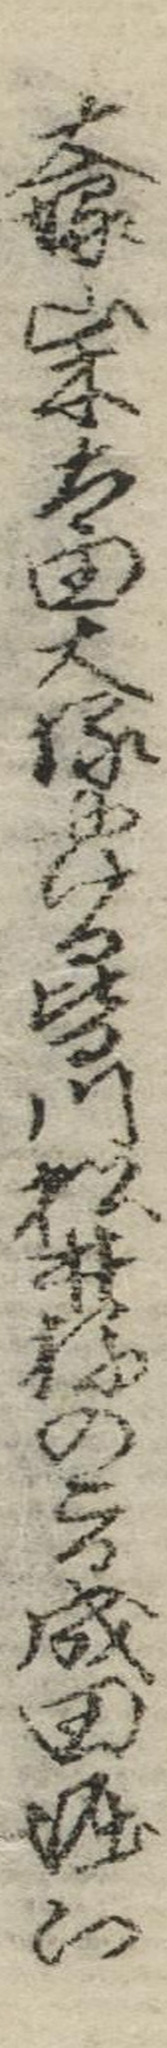大塚山木太田大塚やける皆川松井様のこる成田堀江
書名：江戸御屋鋪方町方共　地震類焼場所巨細書之寫　潰家潰土蔵共取調附街道筋近在迄
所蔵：東京大学地震研究所図書室 Earthquake Research Institute Library, The University of Tokyo, JAPAN
